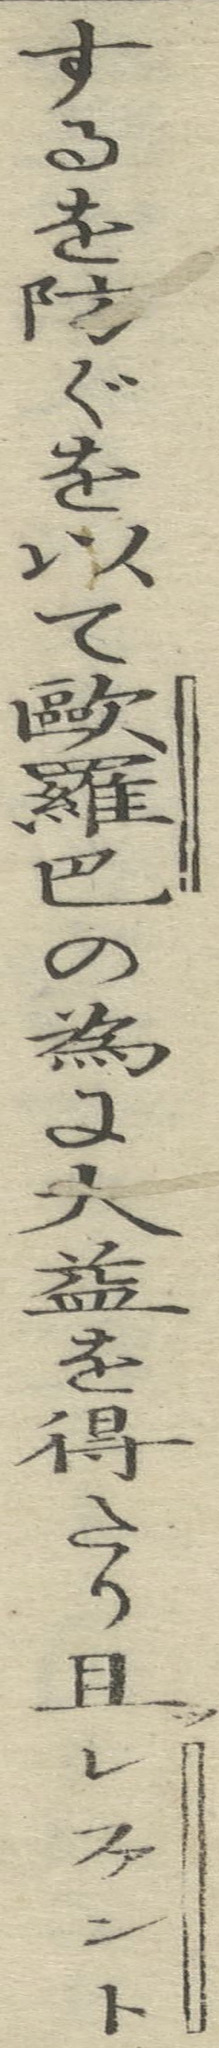するを防ぐを以て欧羅巴の為に大益を得たり且レファント
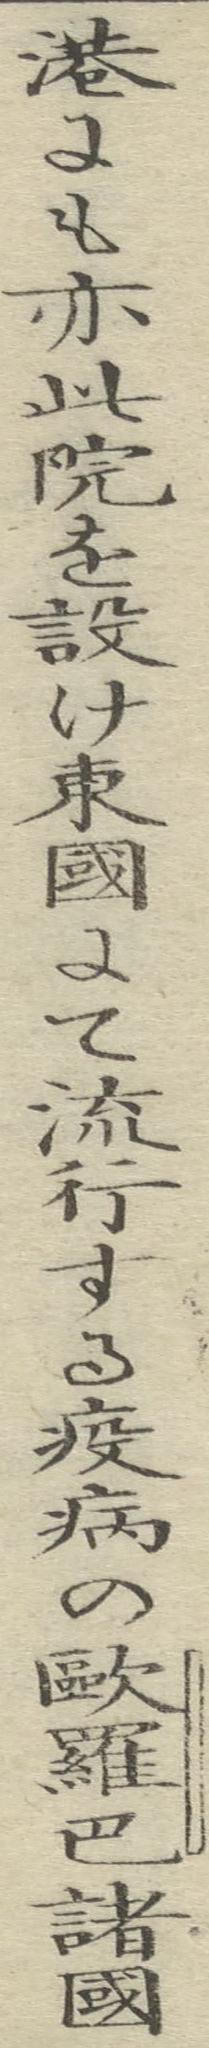港にも亦此院を設け東國にて流行する疫病の歐羅巴諸國
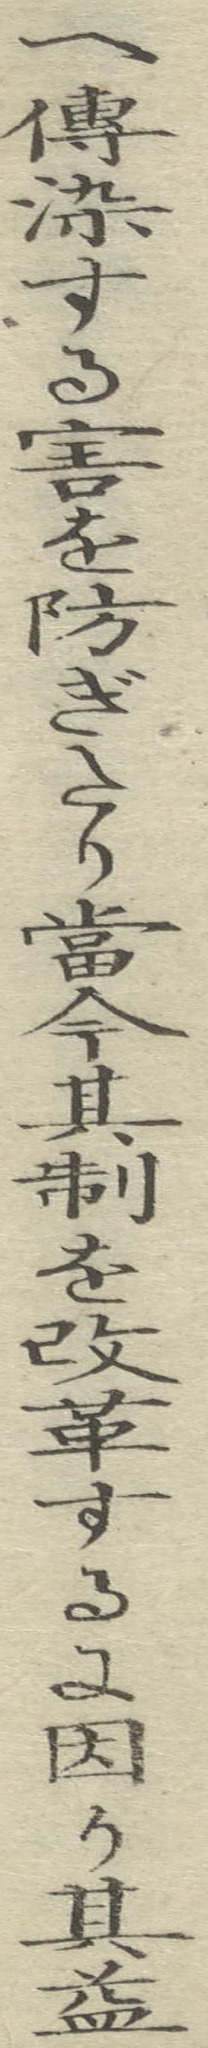へ傅染する害を防ぎたり當今其制を改革するに因り其益
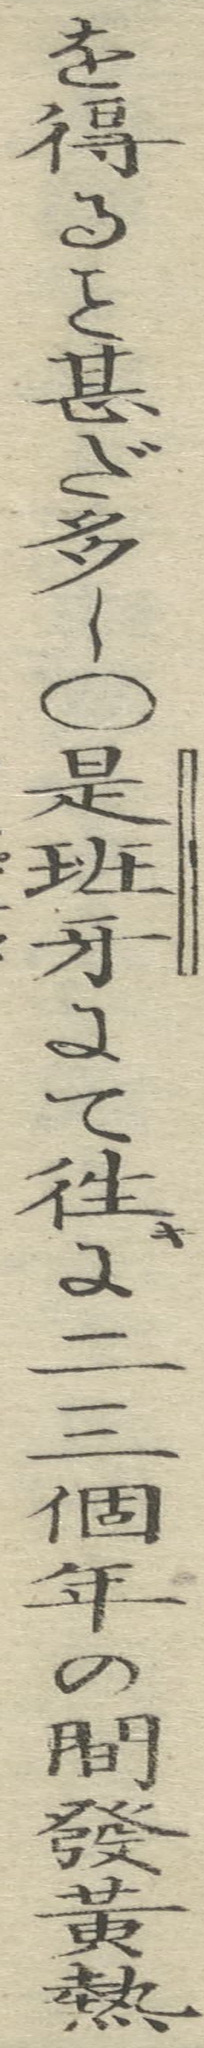を得ること甚だ多し〇是班牙にて往二三個年の間發黄熱
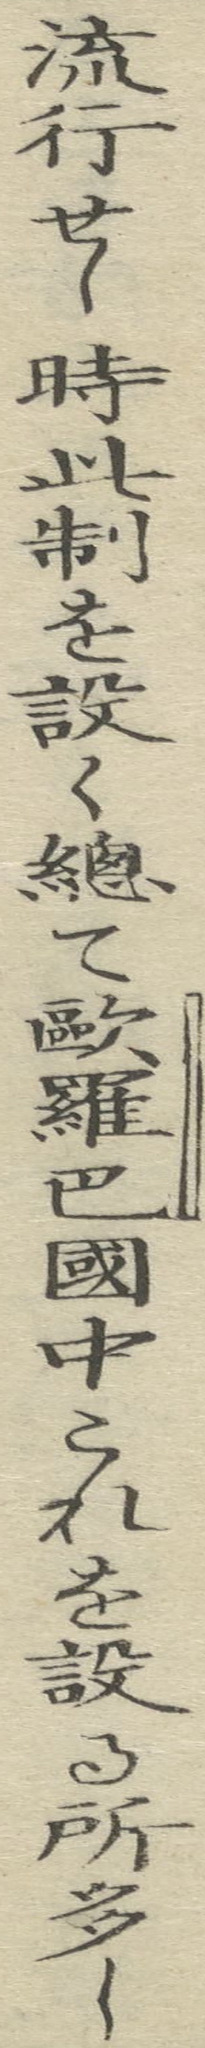流行せし時此制を設く總て歐羅巴國中これを設る所多し
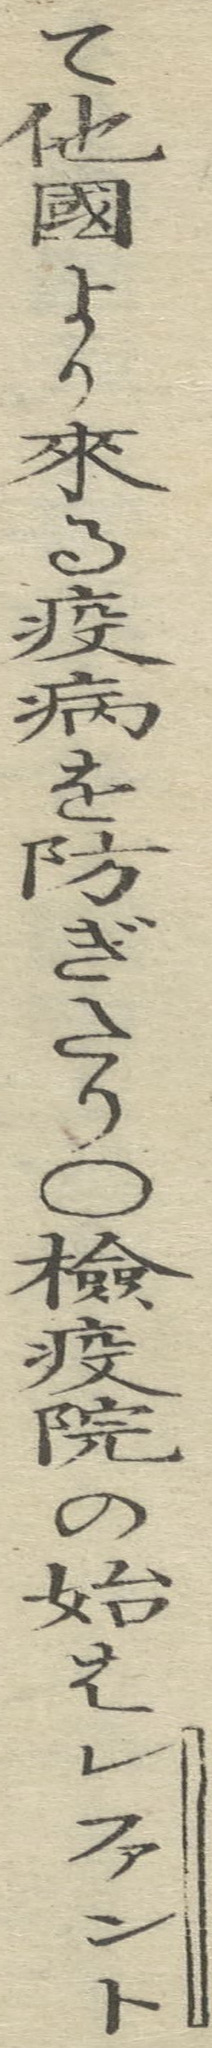て他國より來る疫病を防ぎたり〇檢疫院の始はレファント
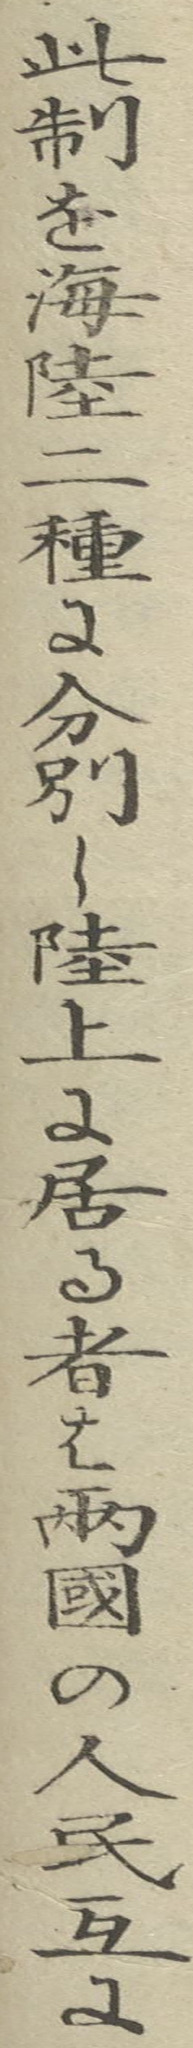此制を海陸二種に分別し陸上に居る者は両國の人民互に
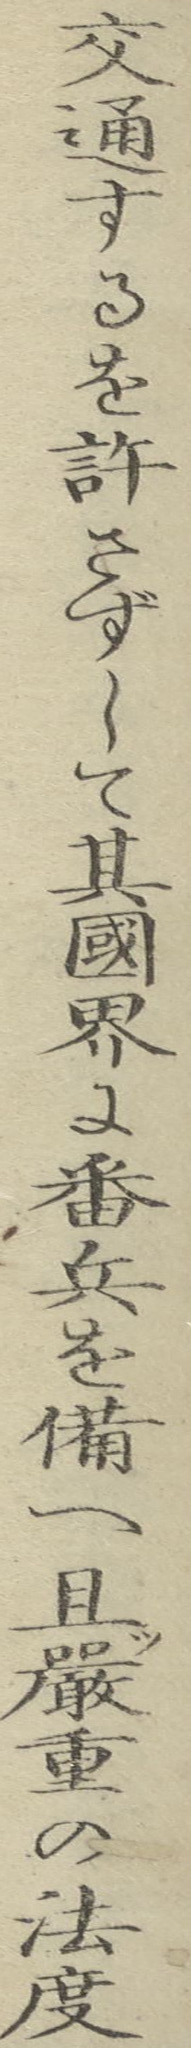交通するを許さずして其國界に番兵を備へ且厳重の法度
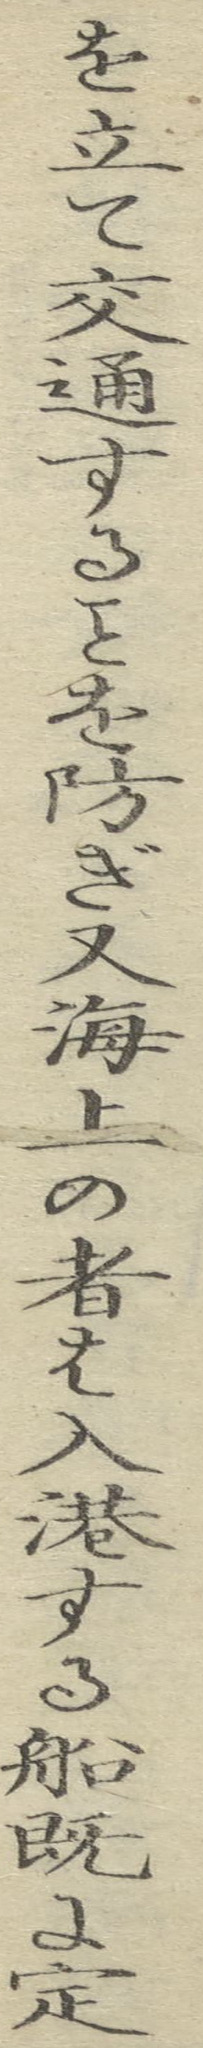を立て交通することを防ぎ又海上の者は入港する船既に定
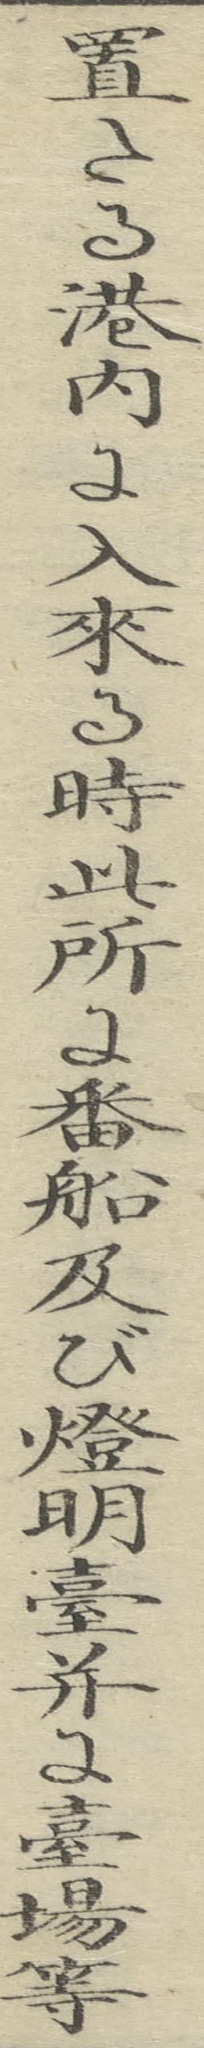置たる港内に入來る時此所に番船及び燈明臺幷に大場等
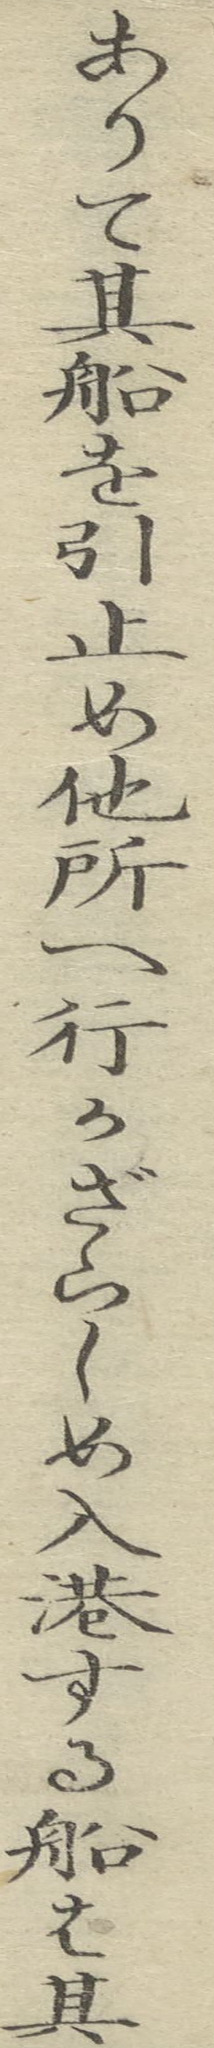ありて其船を引止め他所へ行かざらしめ入港する船は其
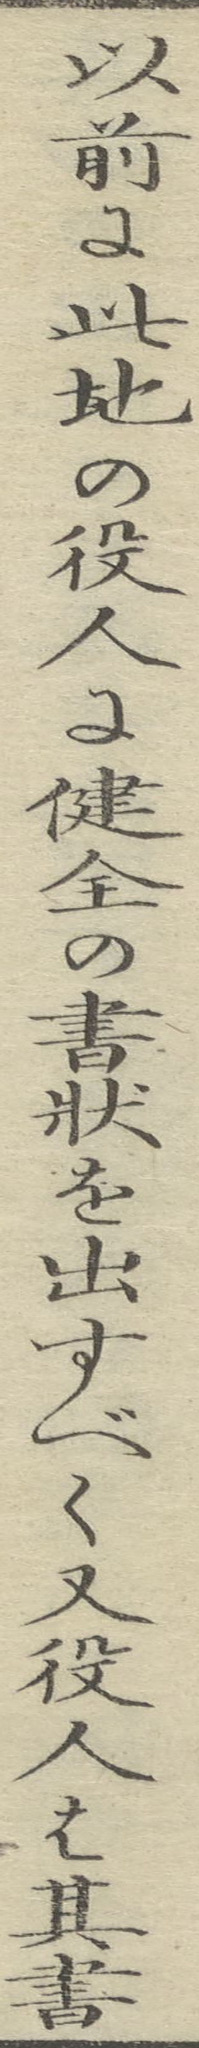以前に此地の役人に健全の書状を出すべし又役人は其書
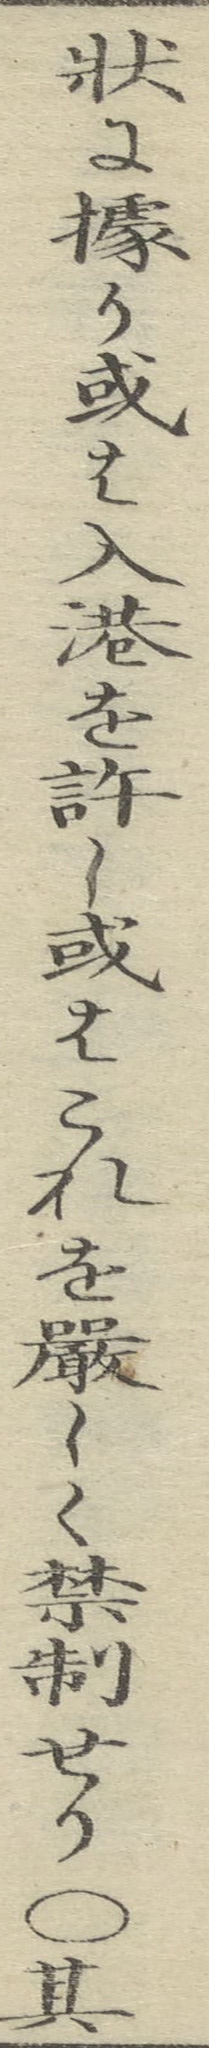状に據り或は入港を許し或はこれを厳しく禁制せり〇其
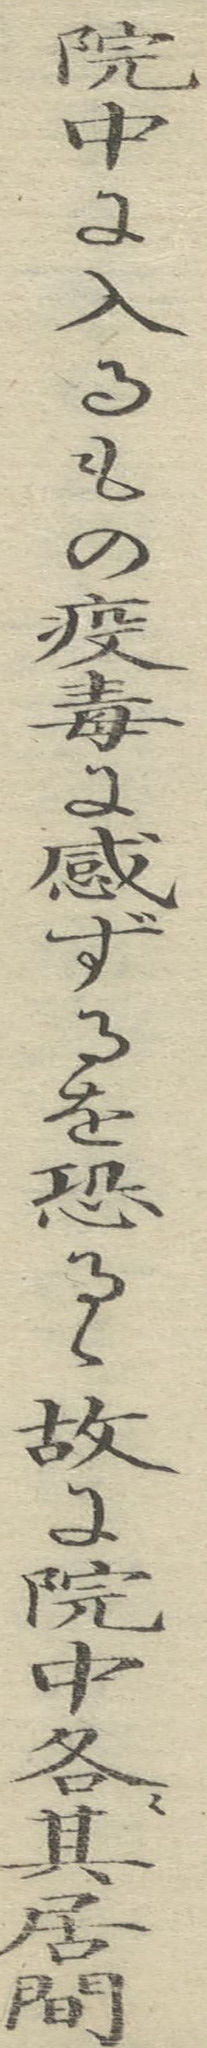院中に入るもの疫毒に感ずるを恐るゝ故に院中各其居間
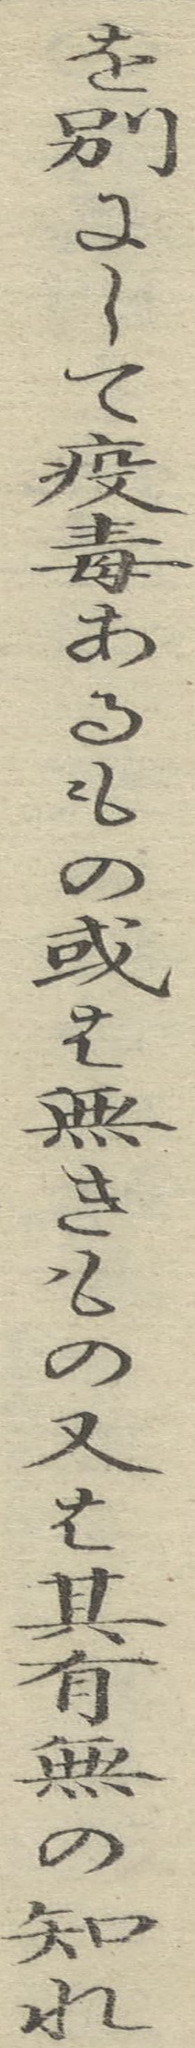を別にして疫毒あるもの或は無きもの又は其有無の知れ
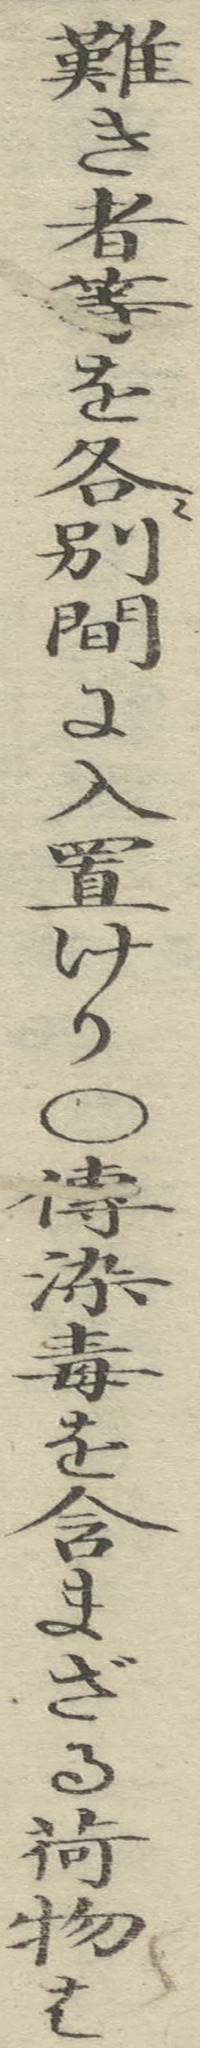難き者等を各別間に入置けり〇傅染毒を含まざる荷物は
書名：官版疫毒預防説　全
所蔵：東京大学総合図書館 General Library in the University of Tokyo, JAPAN
